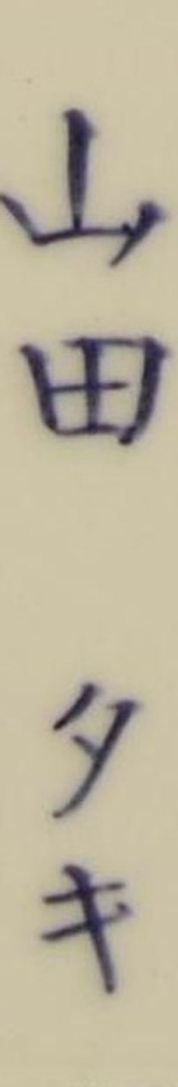山田タキ
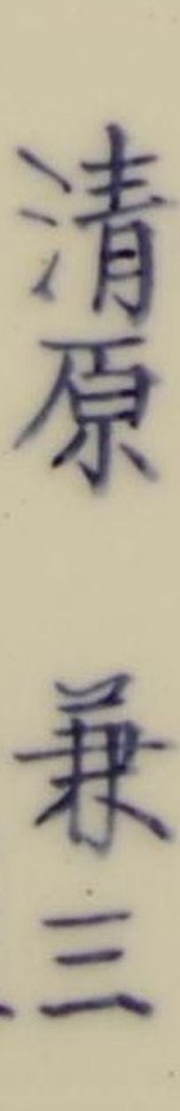清原兼三

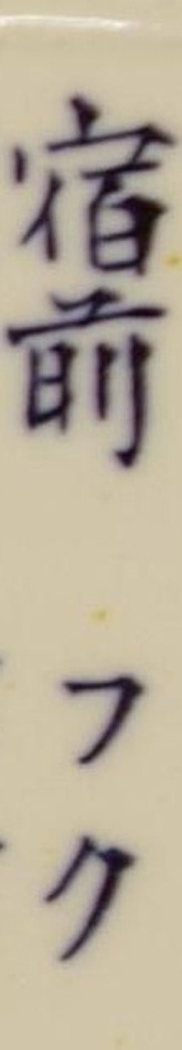宿前フク
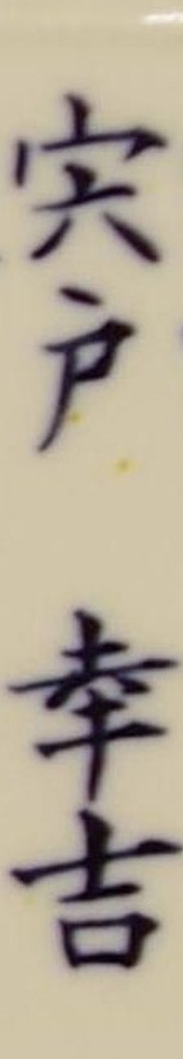宍戸幸吉
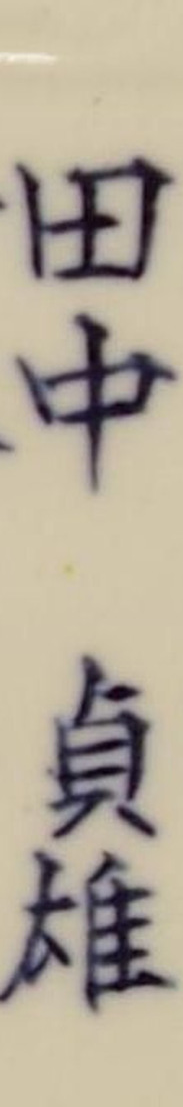田中貞雄
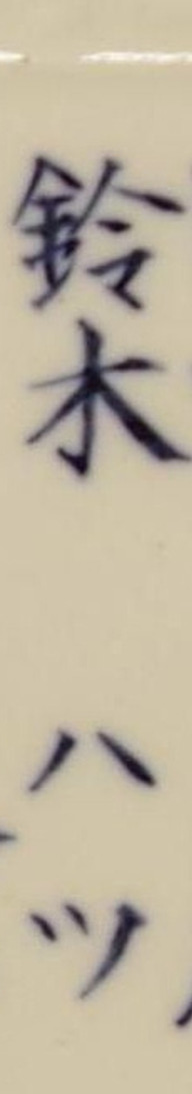鈴木ハツ
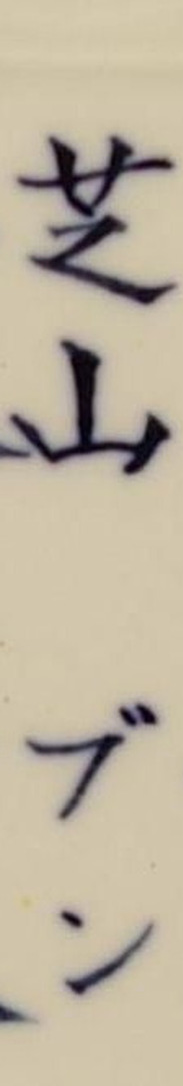芝山ブン
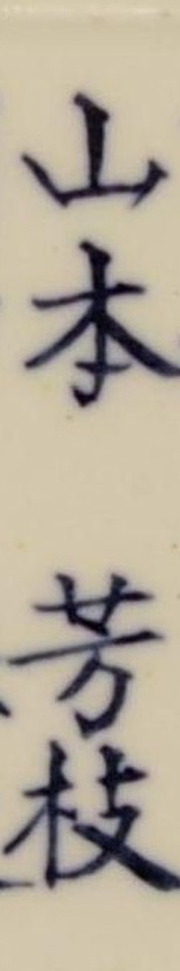山本芳枝
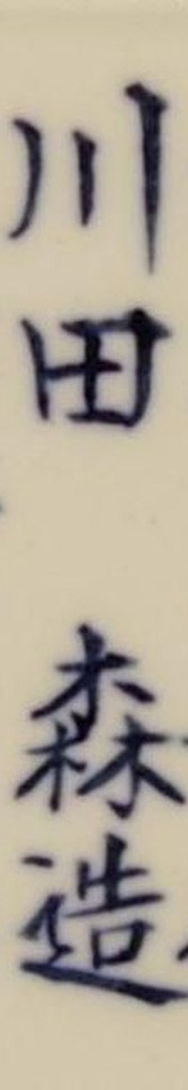川田森造
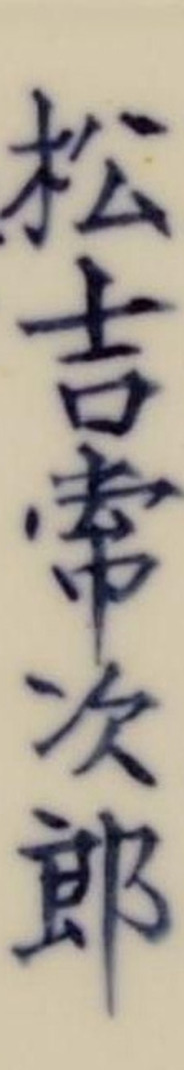松吉常次郎
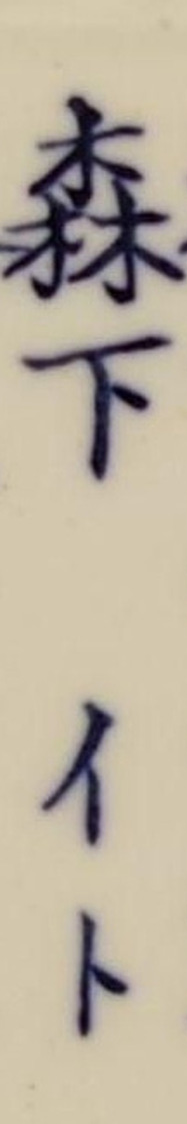森下イト
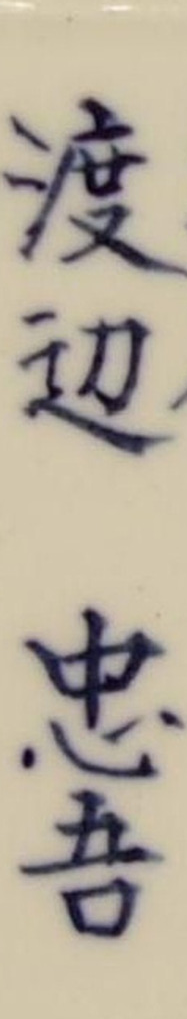渡辺忠吾
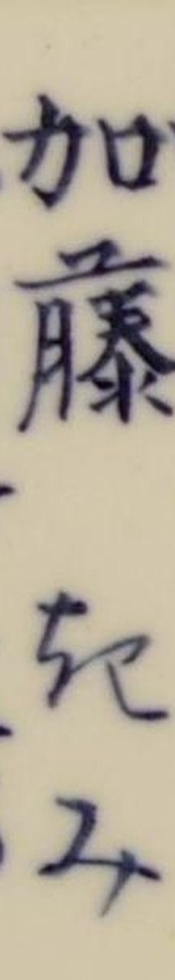加藤きみ
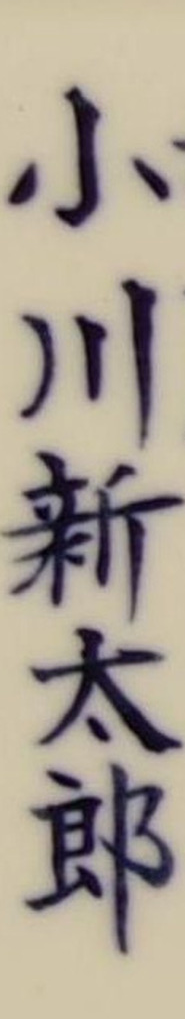小川新太郎
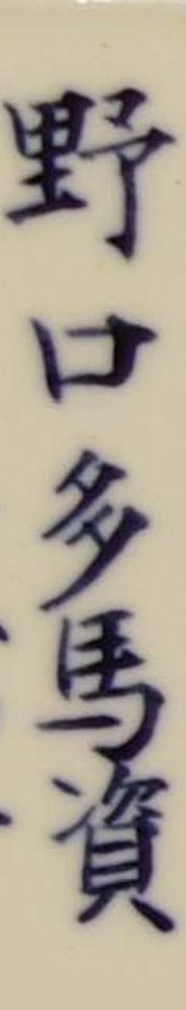野口多馬資
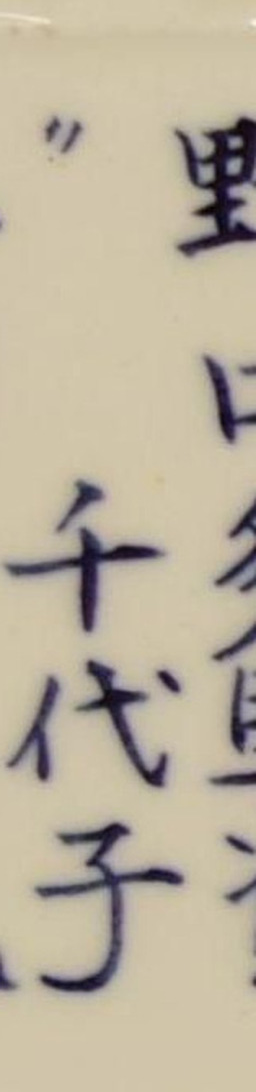千代子
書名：E~L
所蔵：高野山金剛峯寺
